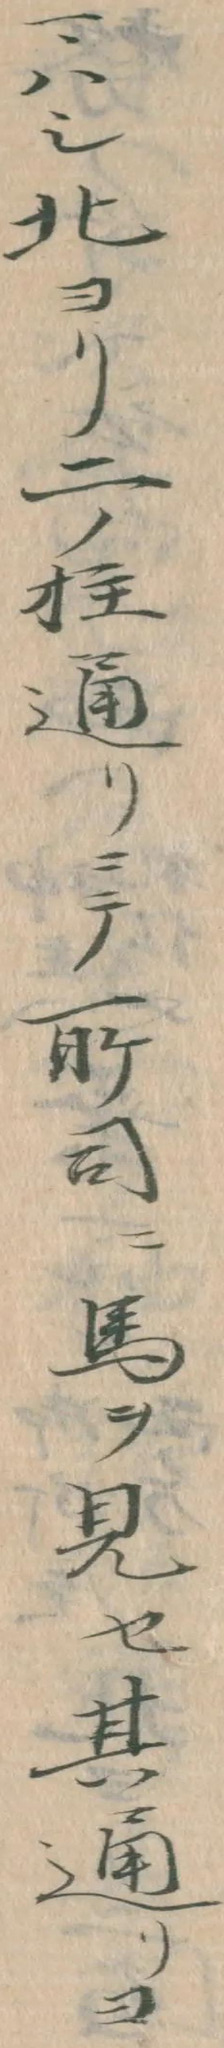マハシ北ヨリ二ノ柱通リニテ所司ニ馬ヲ見セ其通リヨ
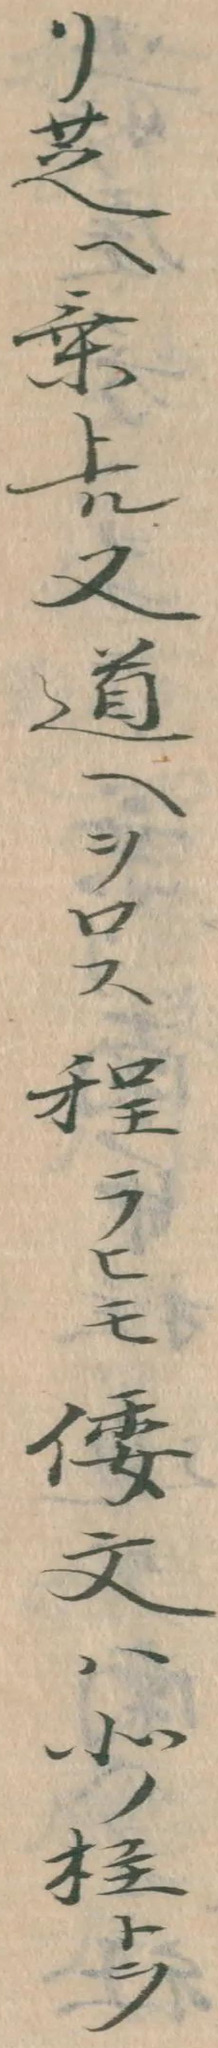リ芝ヘ乗上ル又道ヘヲロス程ラヒモ倭文ハ北ノ柱トヲ
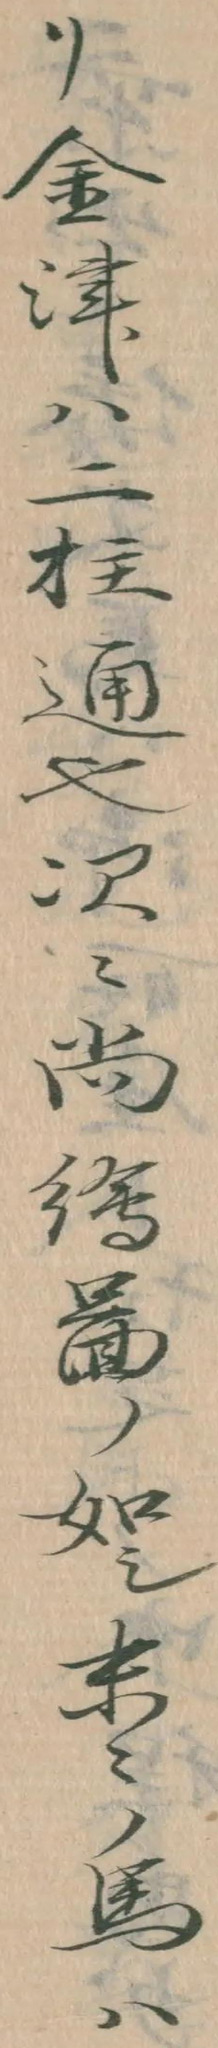リ金津ハ二柱通也次二尚絵図ノ如シ末々ノ馬ハ
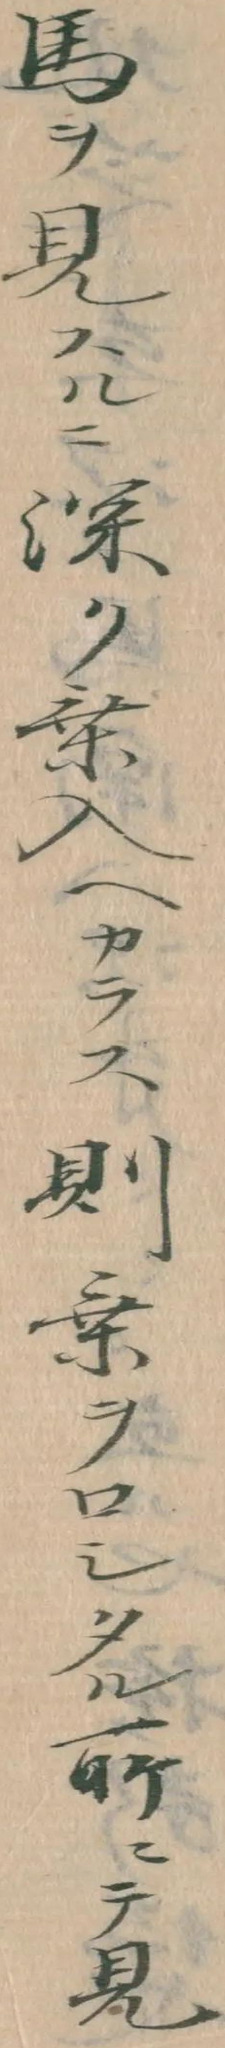馬ヲ見スルニ深ク乗入ヘカラス則乗ヲロシタル所ニテ見
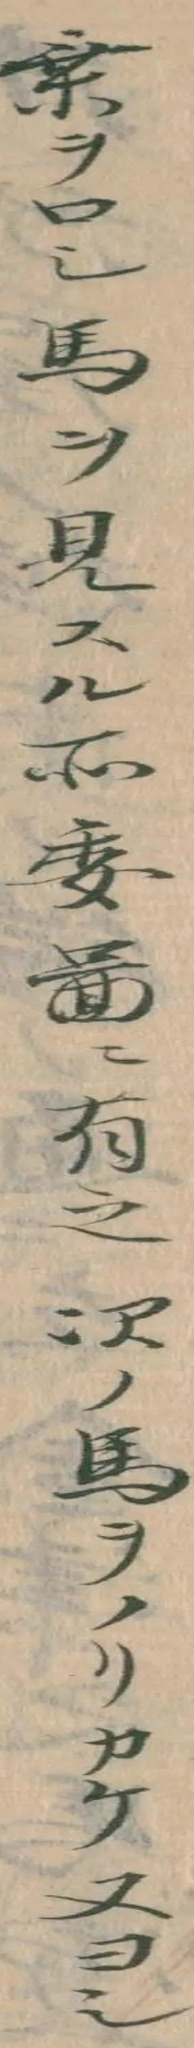乗ヲロシ馬ヲ見スル所委図ニ有之次ノ馬ヲノリカケ又ヨシ
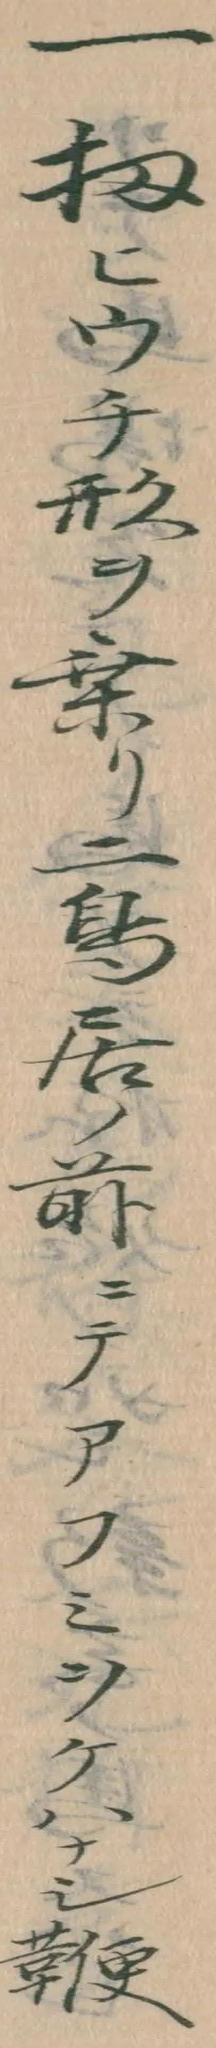一扨ヒウチ形ヲ乗リ二鳥居ノ前ニテアフミヲケハナシ鞭
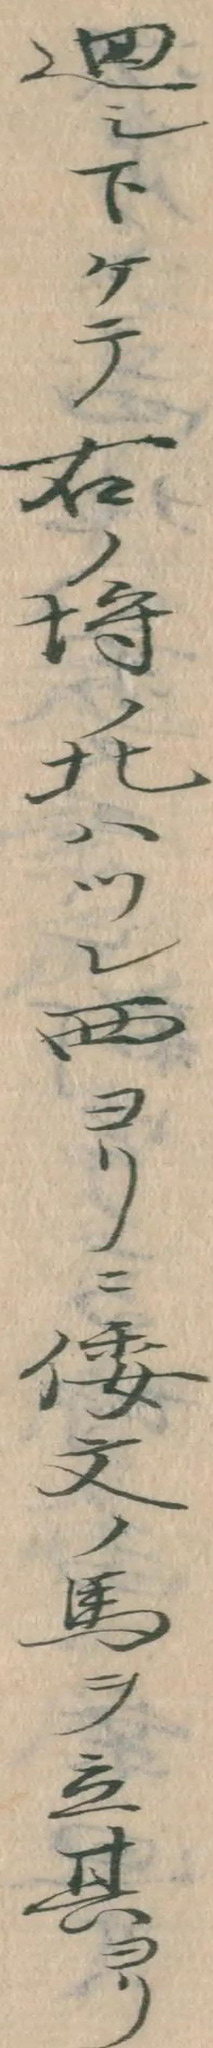廻シ下ケテ右ノ埒ノ北ハツレ西ヨリニ倭文ノ馬ヲ立其ヨリ
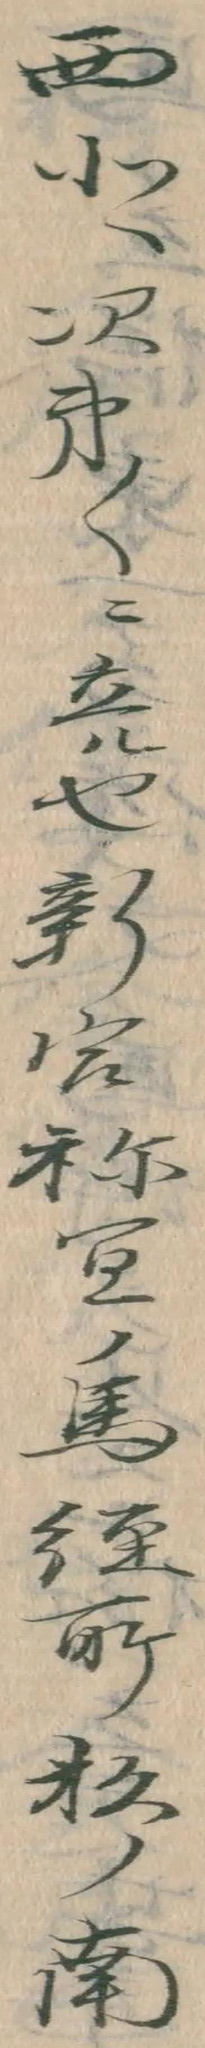西北ヘ次第〳〵ニ立ル也新宮禰宜ノ馬経所杦ノ南
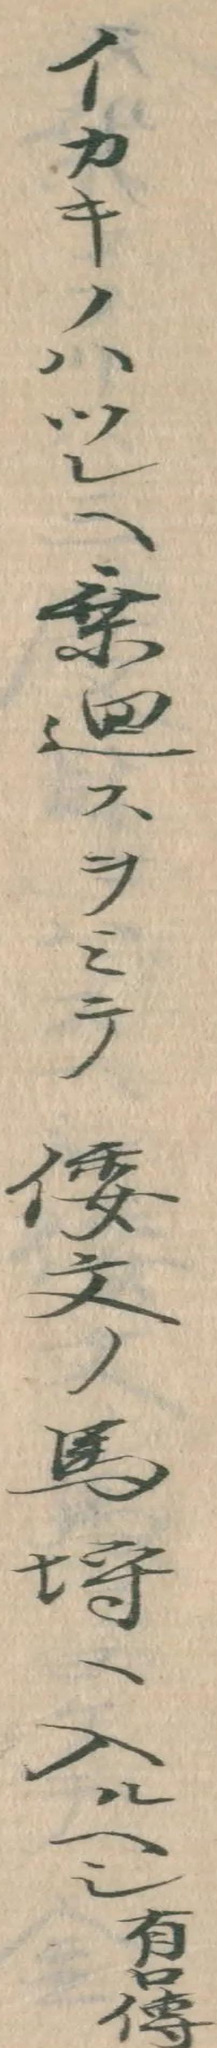イカキノハツレへ乗廻スヲミテ倭文ノ馬埒ヘ入ルヘシ有口伝
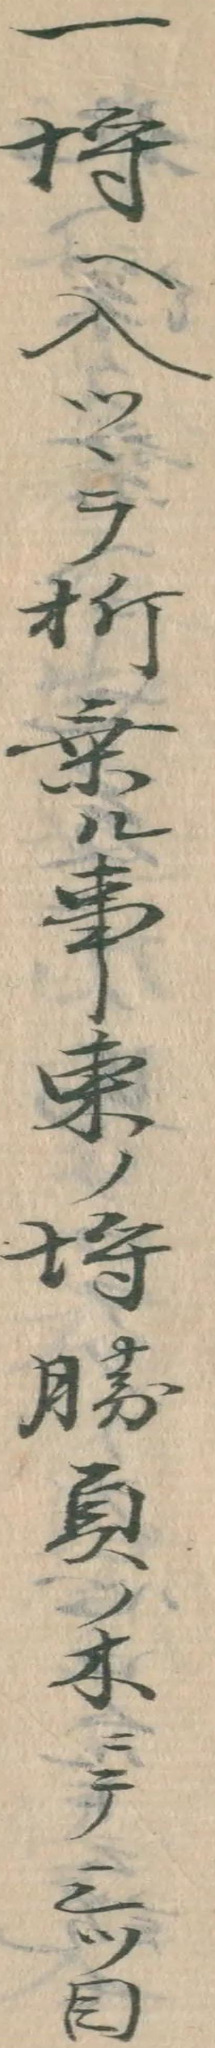一埒ヘ入ツヽラ折乗ル事東ノ埒勝負ノ木ニテ三ツ目
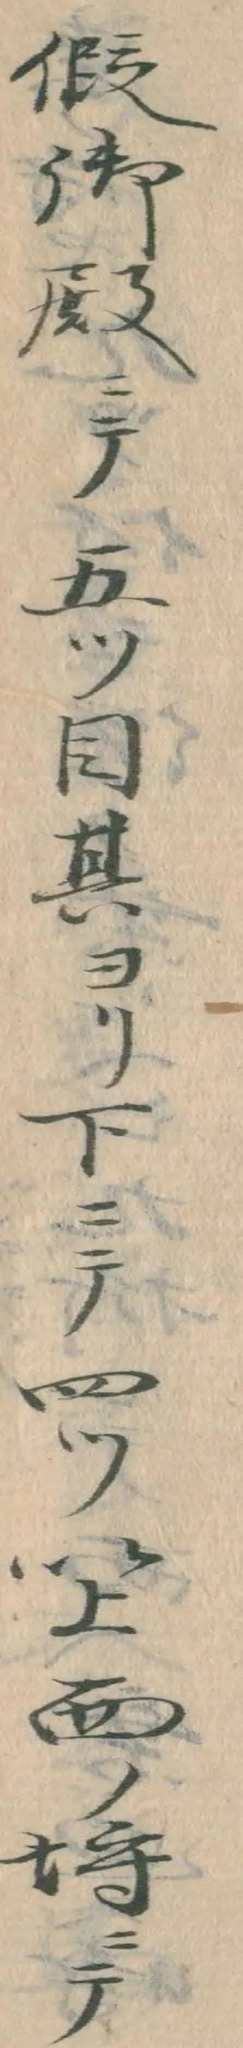仮御殿ニテ五ツ目其ヨリ下ニテ四ツ以上西ノ埒ニテ

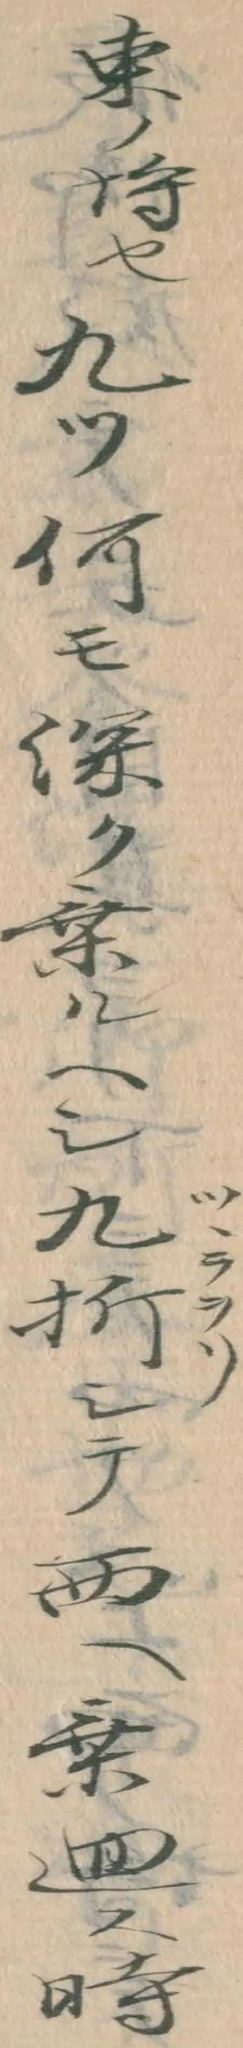東ノ埒也九ツ何モ深ク乗ルヘシ九折シテ西ヘ乗廻ス時
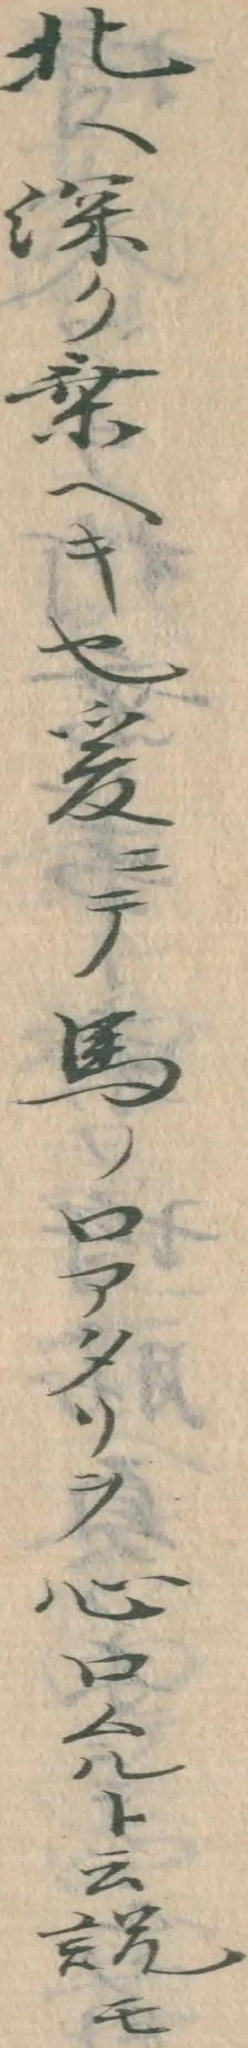北ヘ深ク乗ヘキ也爰ニテ馬ノ口アタリヲ心ロ允ト云説モ
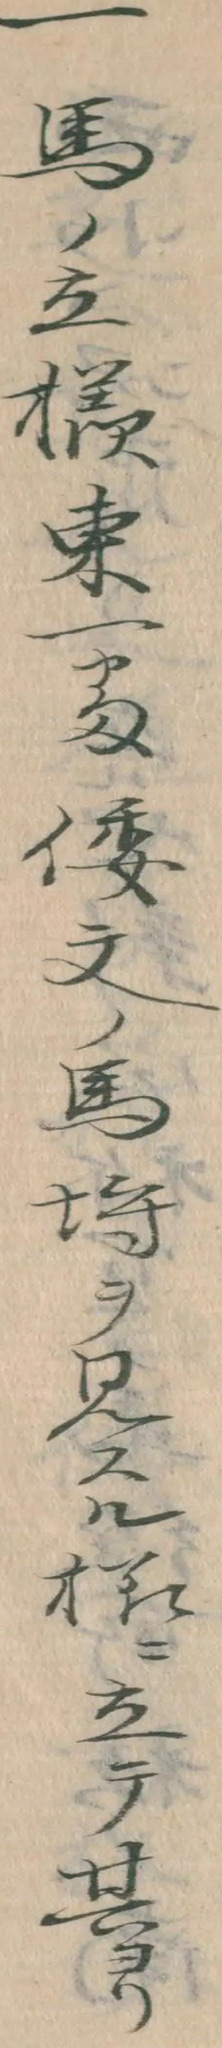一馬ノ立様東一番倭文ノ馬埒ヲ見スル様ニ立テ其ヨリ
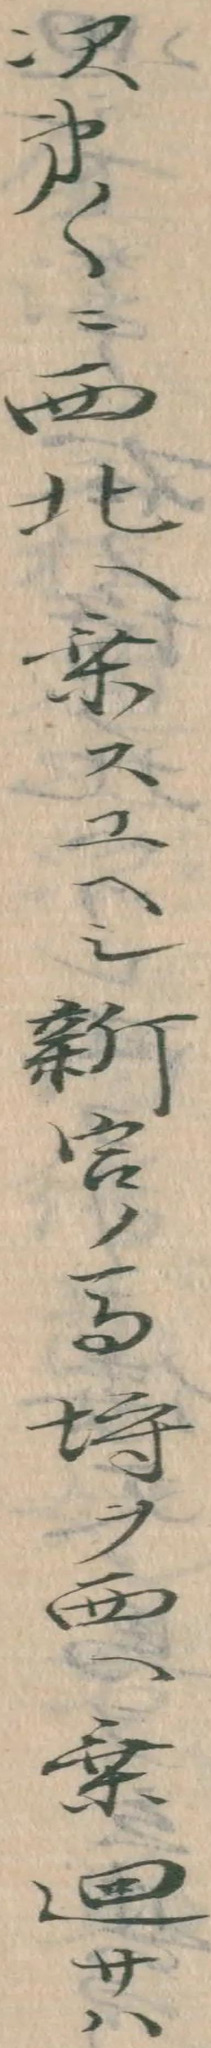次第〳〵ニ西北へ乗スユヘシ新宮ノ馬埒ヲ西ヘ乗廻サハ
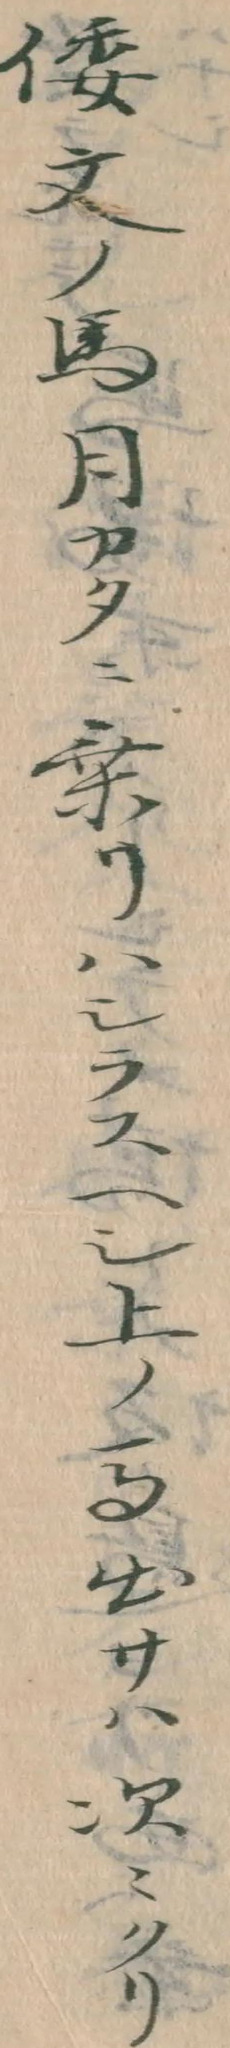倭文ノ馬月カタニ乗リハシラスヘシ上ノ馬出サハ次々クリ
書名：賀茂社記録. 第11冊
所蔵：国立国会図書館 National Diet Library, JAPAN
